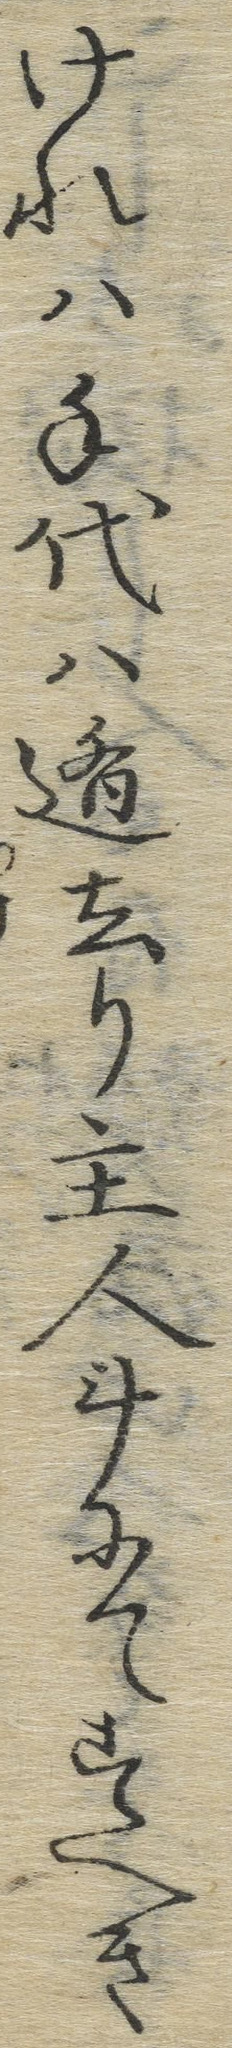けれは手代は遁去り主人斗にてすへき
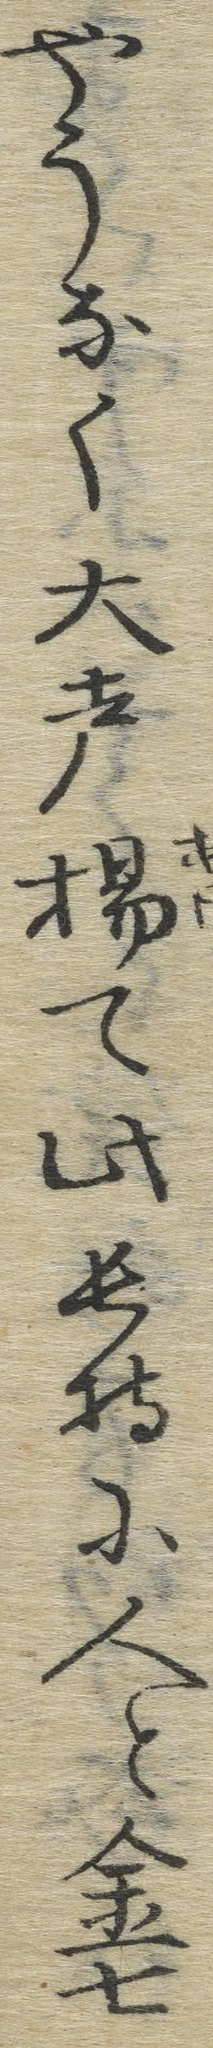やうなく大声揚て此長持に人と金七
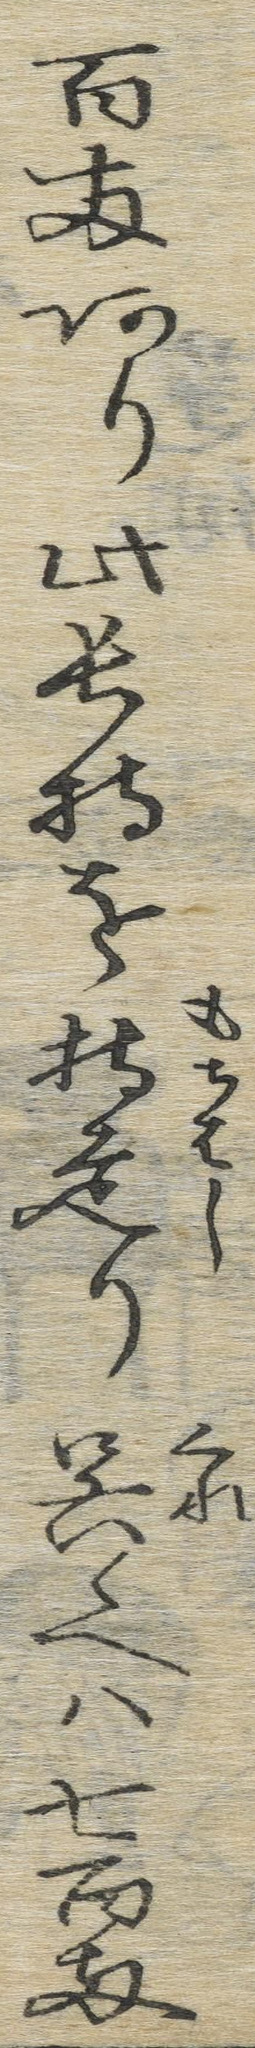百両あり此長持を持走り呉候へは七百両
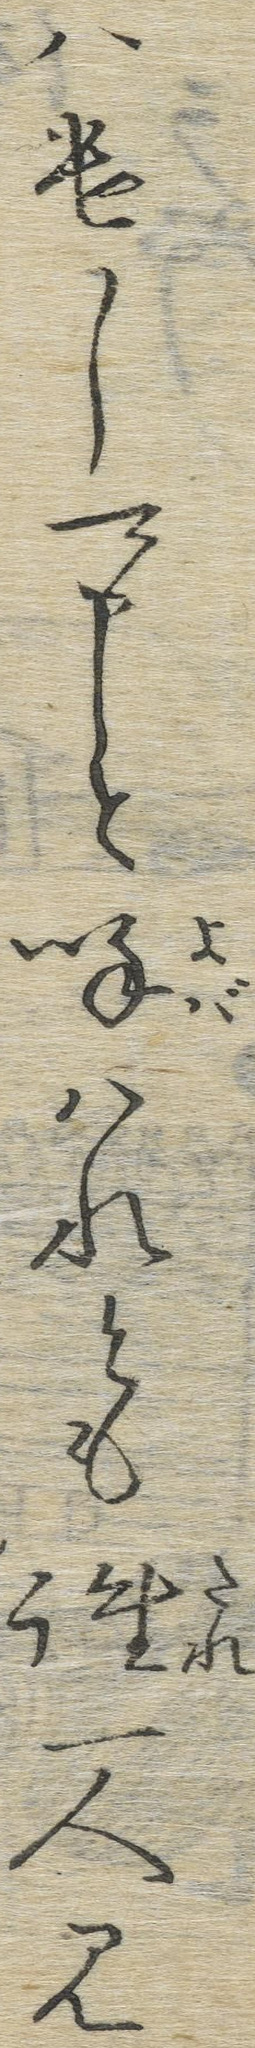は遣し可申と呼はれとも誰一人見
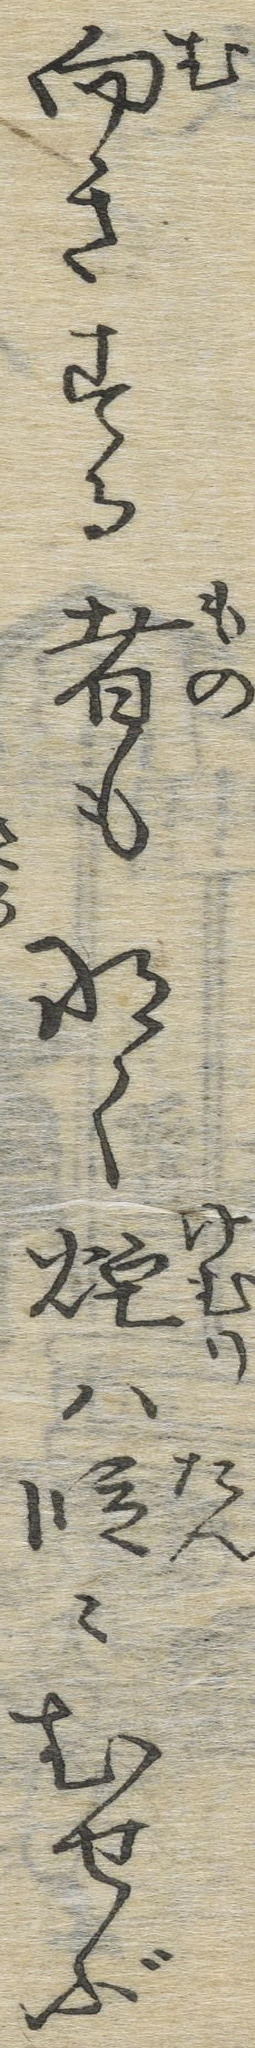向きする者もなく煙は段〻むせぶ
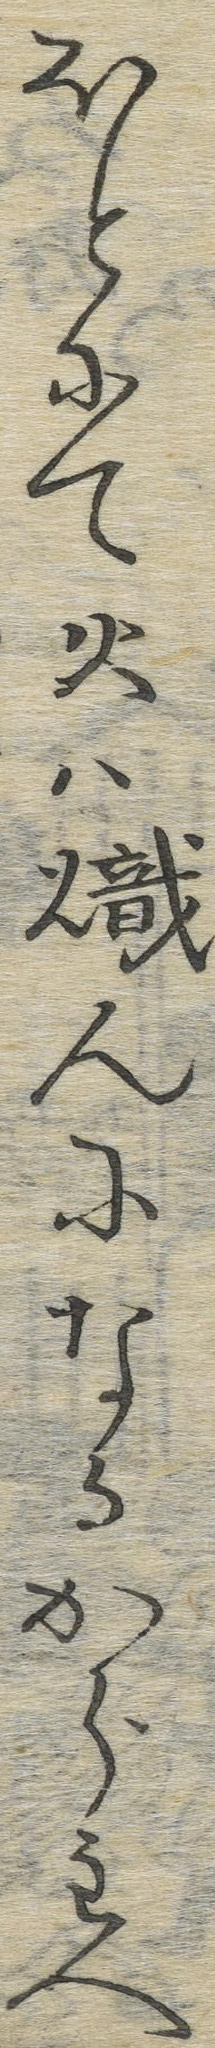ほとにて火は熾んになるから主人
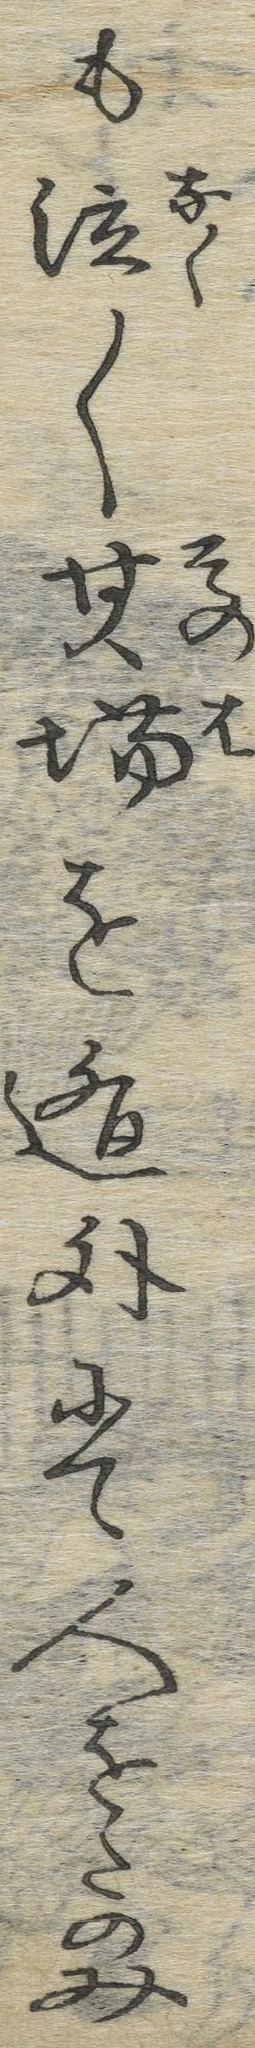も泣〳〵其場を遁外にて人をたのみ
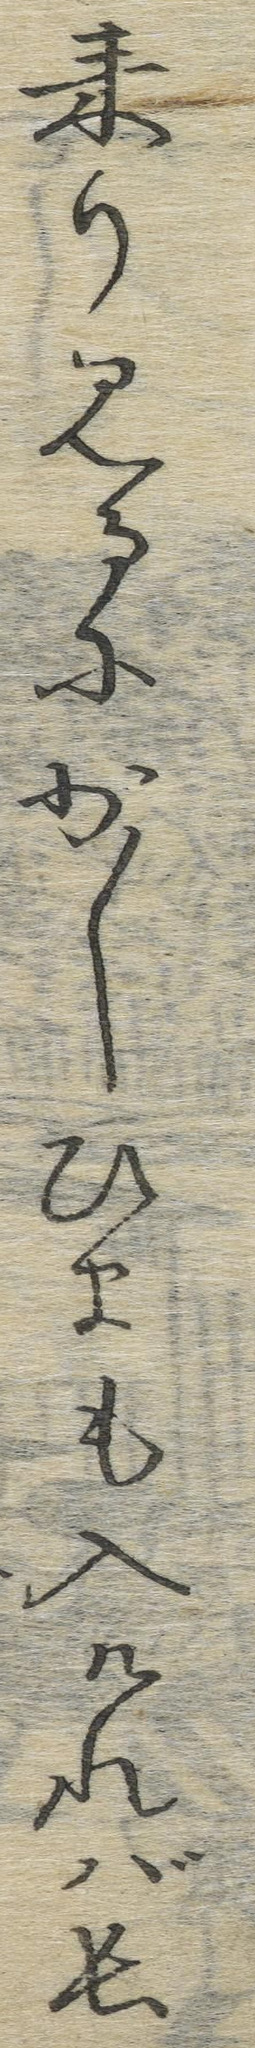来り見るに少〳〵ひまも入ければ長
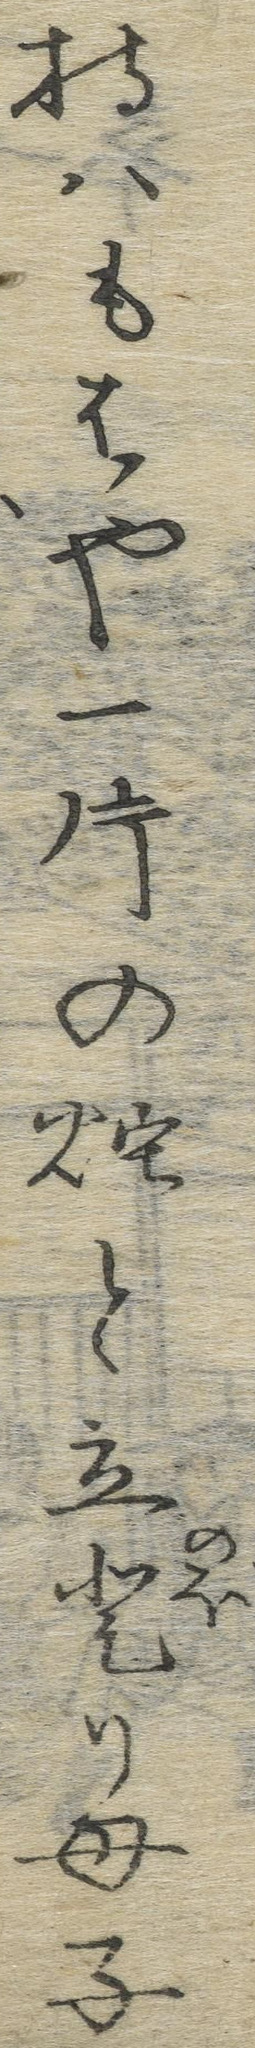持はもはや一片の煙と立登り母子
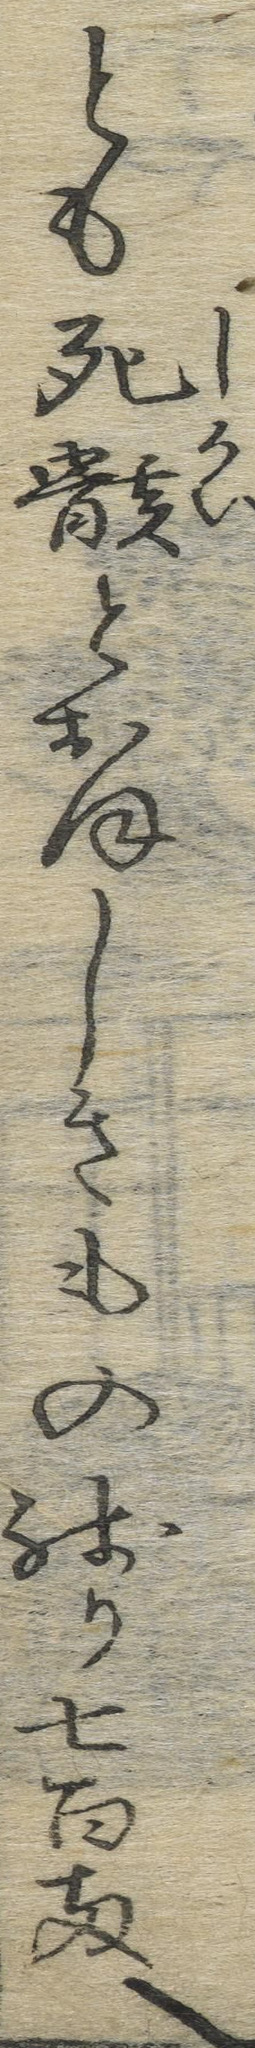とも死骸とおほしきもの残り七百両

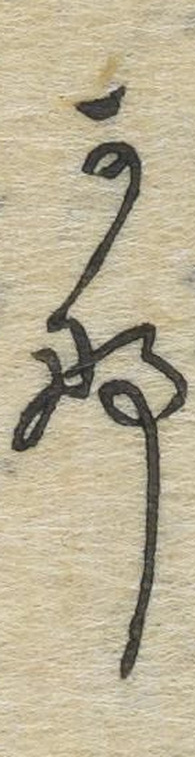寶なし
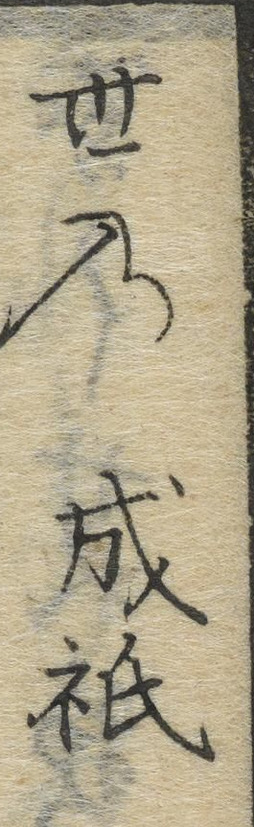世の成祇
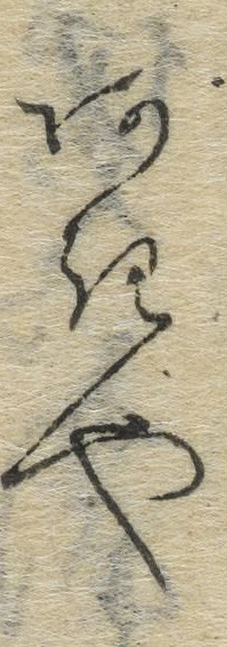あきや
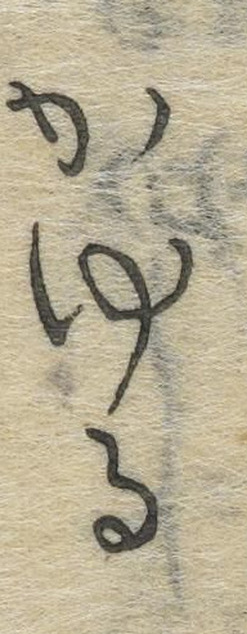かゆる

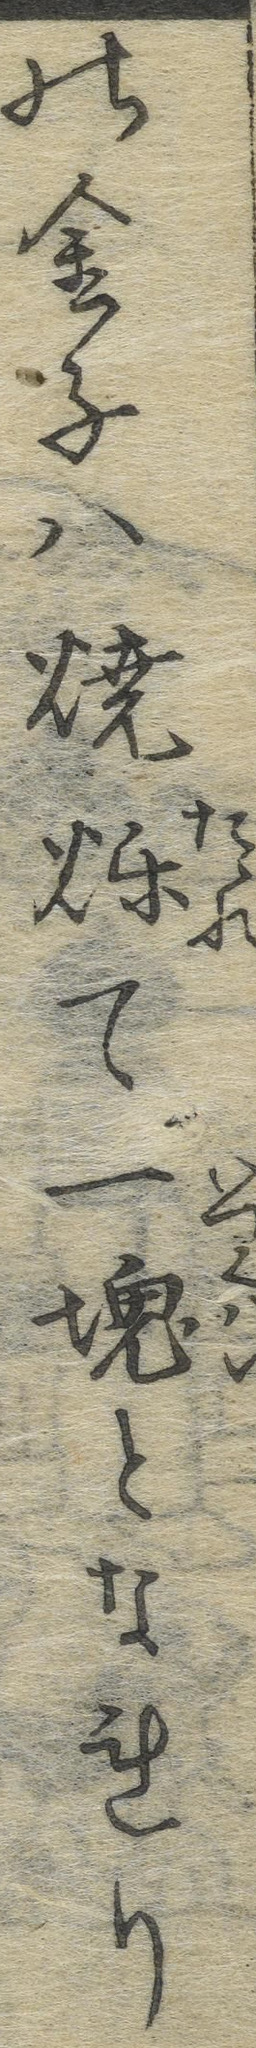の金子は焼爍て一塊となれり
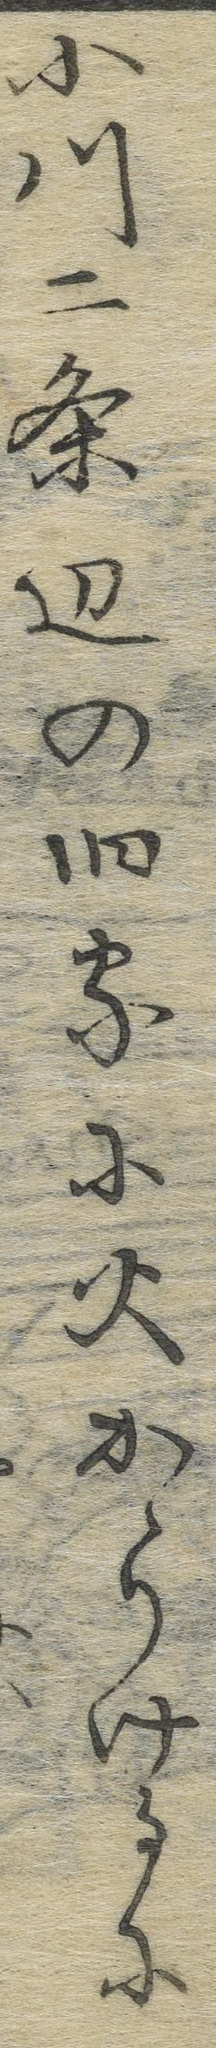小川二条辺の旧家に火かゝりけるに
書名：あきの日照
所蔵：東京大学地震研究所図書室 Earthquake Research Institute Library, The University of Tokyo, JAPAN
